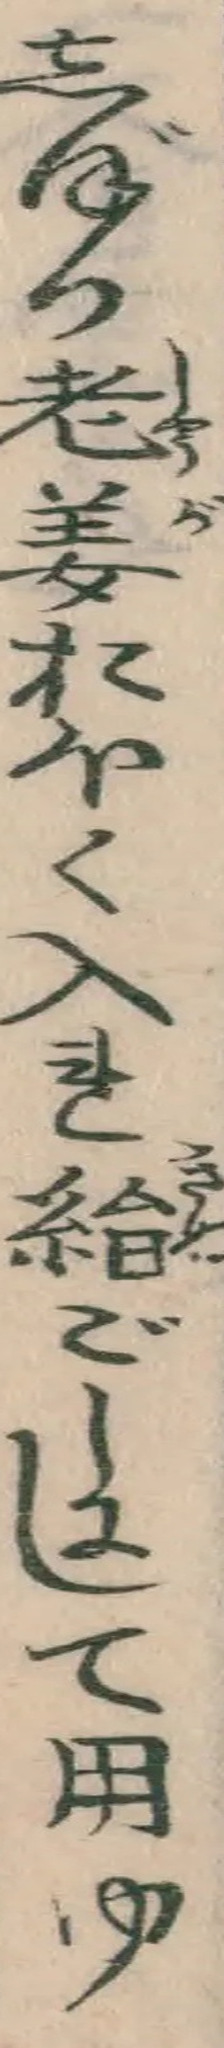しぼり老姜おほく入れ絹ごしにして用ゆ
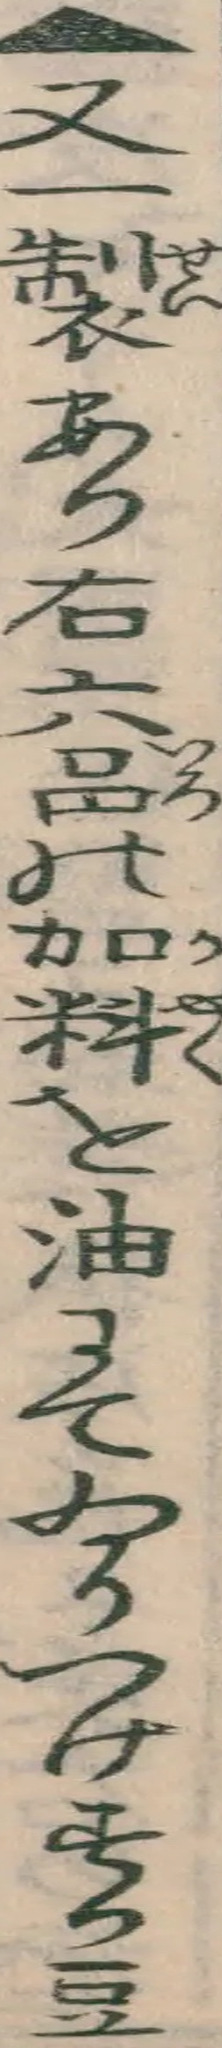▲又一製あり右六品の加料を油にてゐりつけすり豆
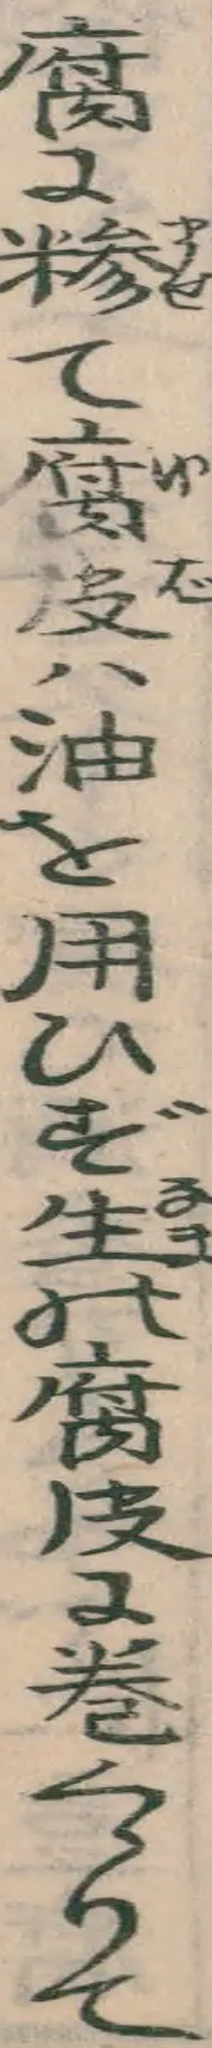腐に糝て腐皮は油を用いず生の腐皮に巻くゝりて
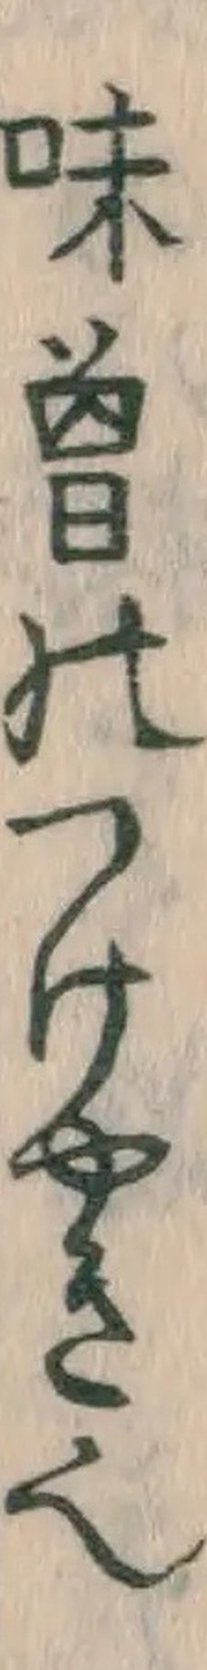味曽のつけやきな也
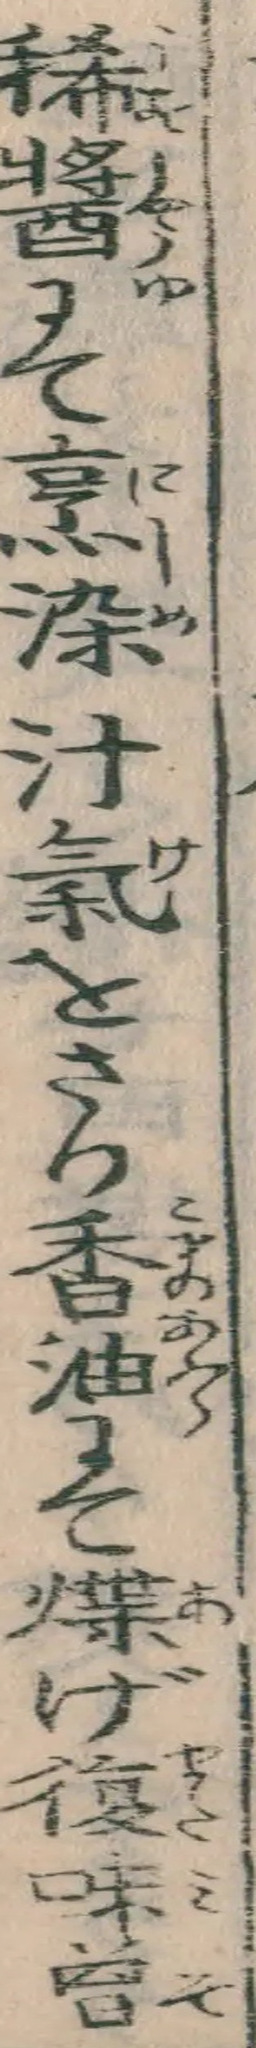稀醤にて烹染汁気をきり香油にて煠げ復味曽
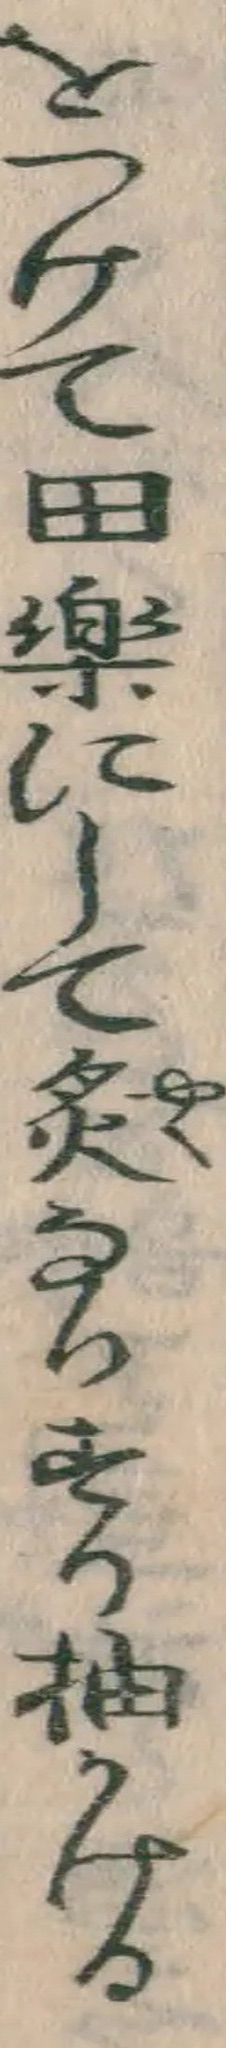をつけて田楽にして炙なりすり柚かける
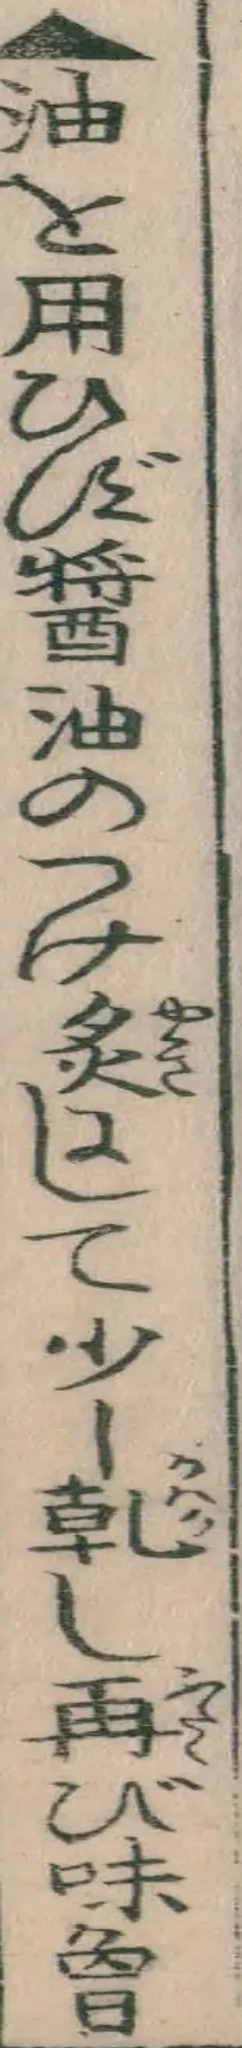▲油を用ひず醤油のつけ炙にして少し乾し再び味曽
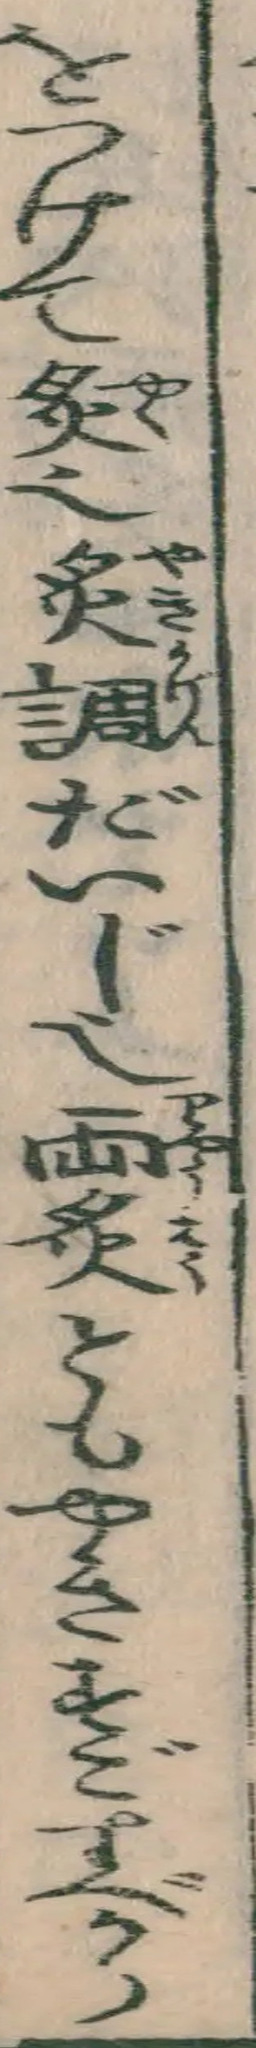をつけて炙也炙調だいじ也両炙ともやきすごすべから

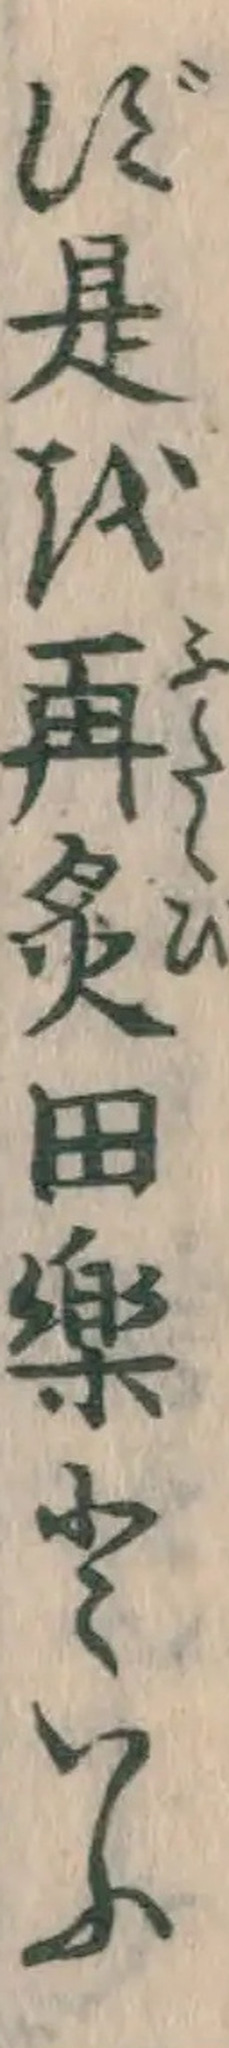ず是を再炙田楽といふ
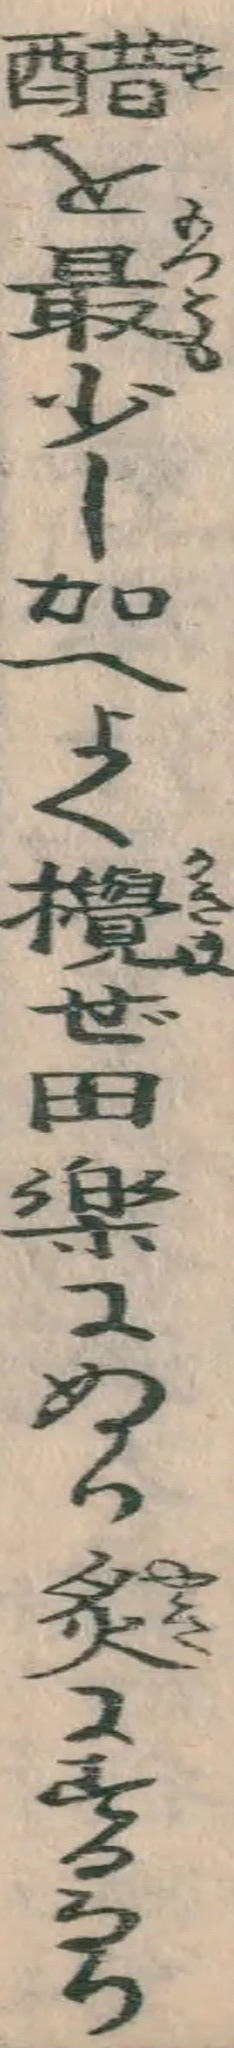醋を最少し加へよく攪ぜ田楽にぬり炙にするなり
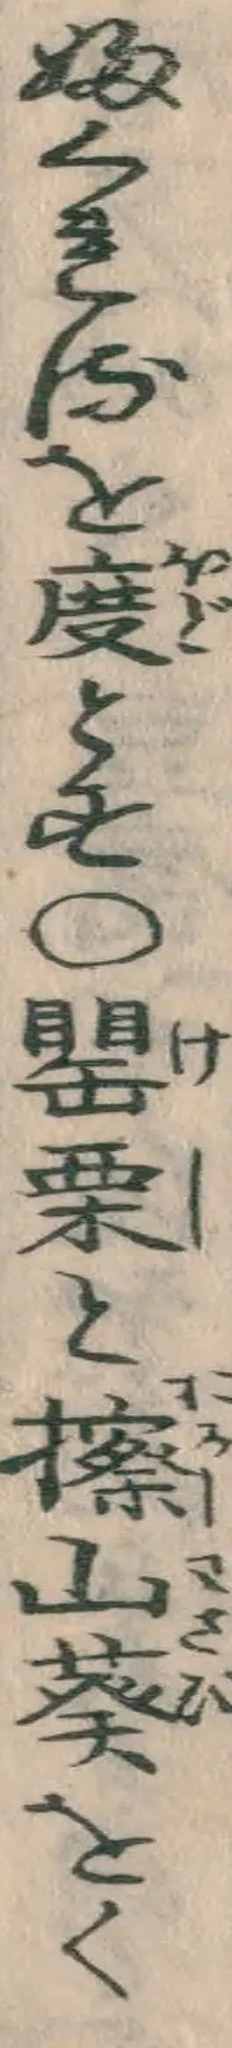ふくれるを度とす○罌粟と擦山葵をく
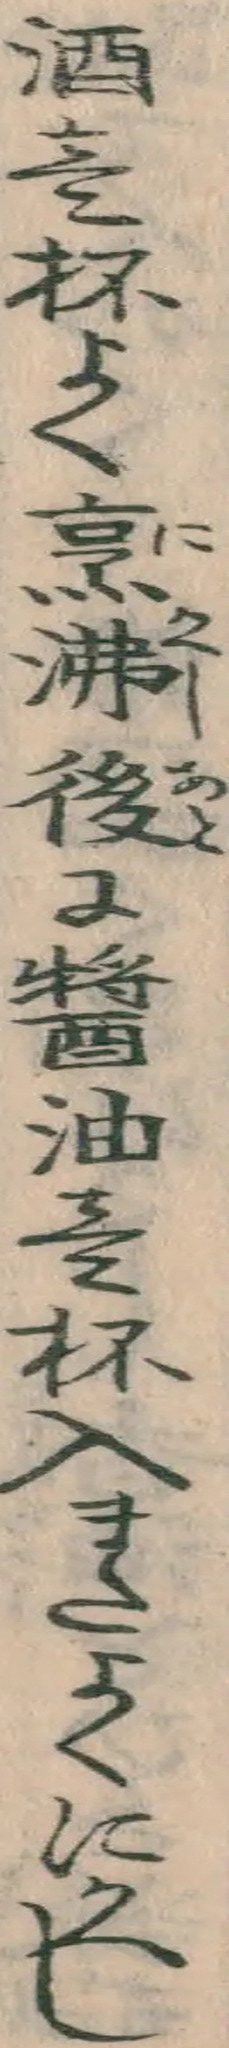酒壱杯よく烹沸後に醤油壱杯入またよくにかへし
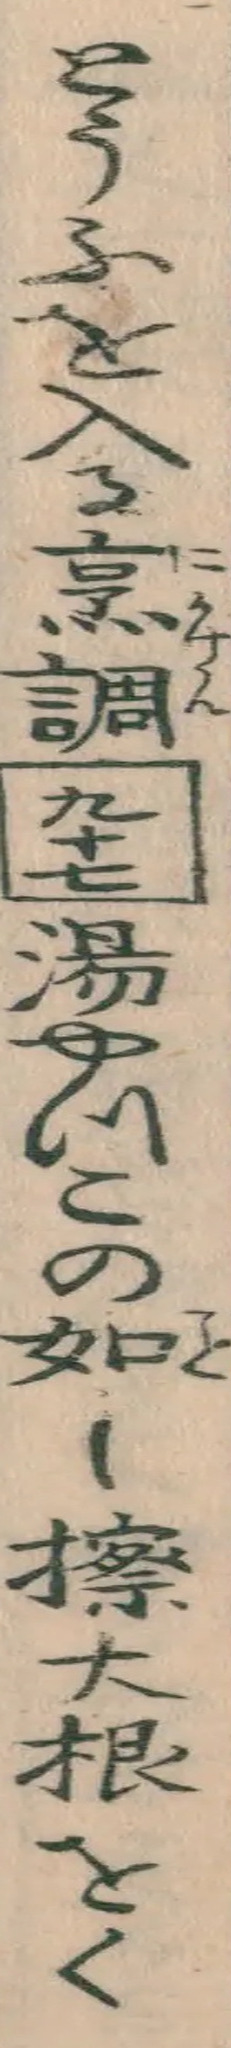とうふを入る烹調[九十七]湯やつこの如し擦大根をく
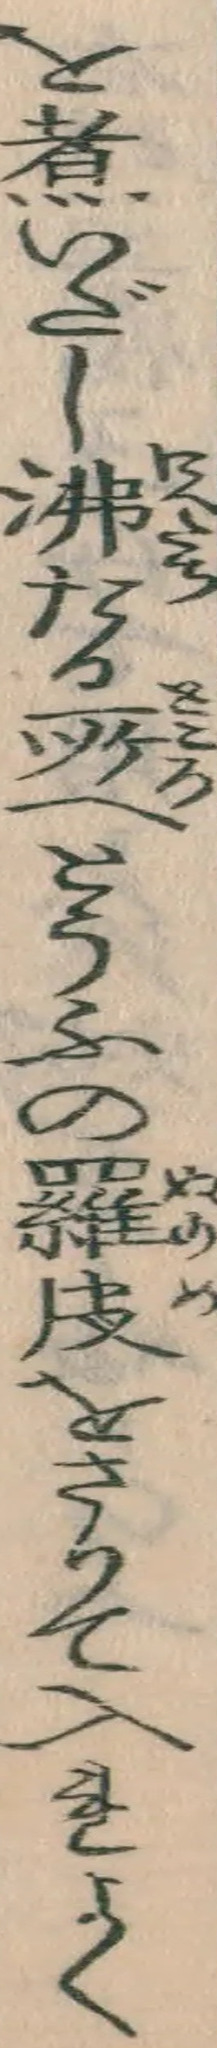を煮いだし沸たる所へとうふの羅皮をさりて入れよく
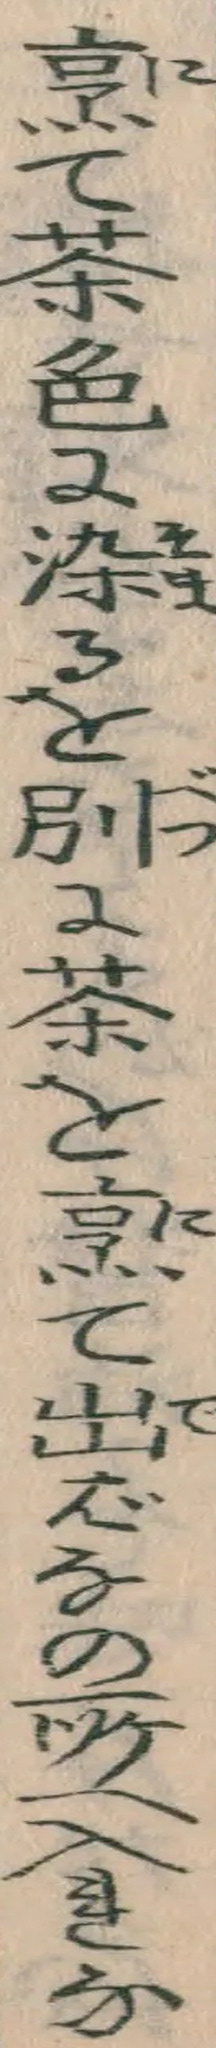烹て茶色に染るを別に茶を烹て出ばなの所へ入れな
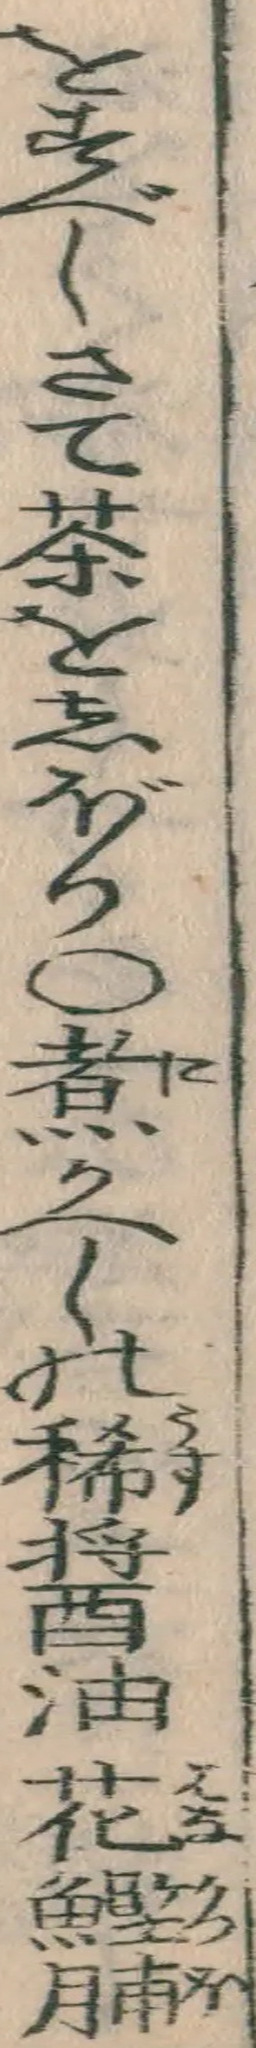をすべしさて茶をしぼり○煮かへしの稀醤油花鰹節
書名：豆腐百珍. [正編]
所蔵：国立国会図書館 National Diet Library, JAPAN
